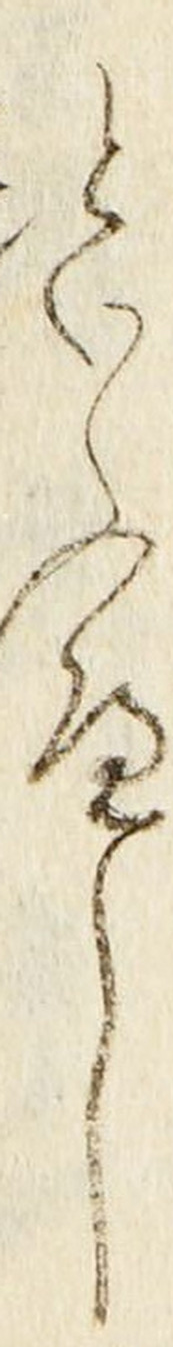といふべし
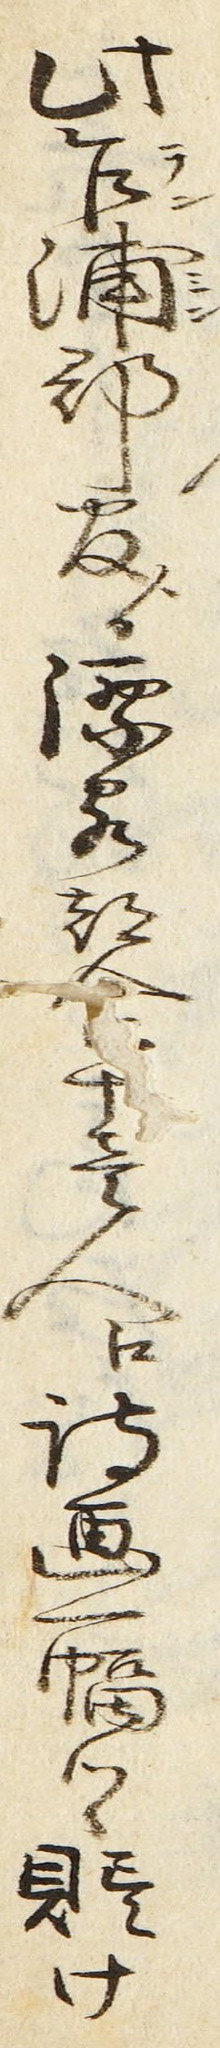此乍浦郡官ゟ漂客都合十壱人え詩画一幅ツヽ贐け

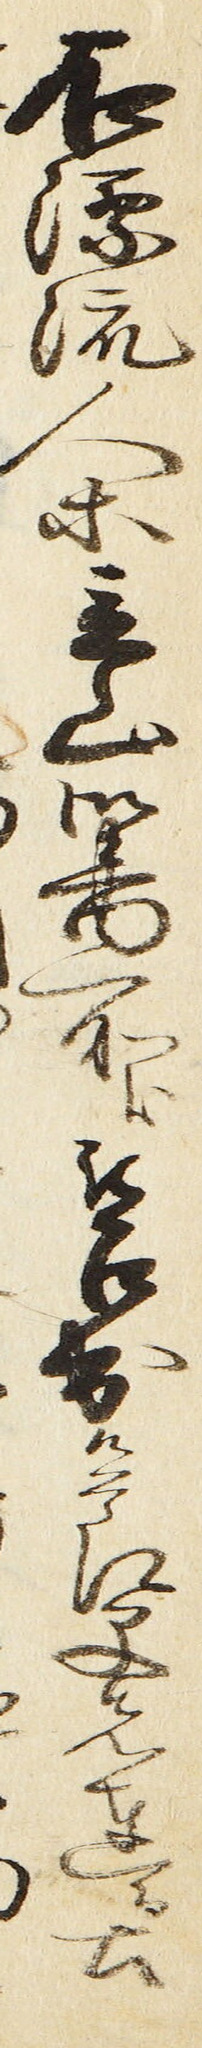右漂流人等立山御番所え被召出候節早先達而土
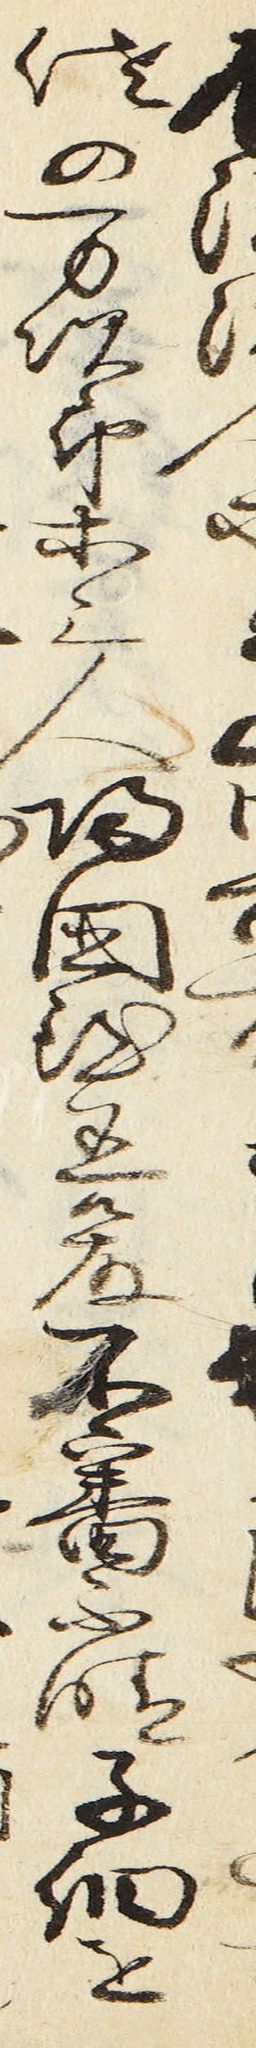佐の万次郎等三人帰国致有候故不審不晴子細を
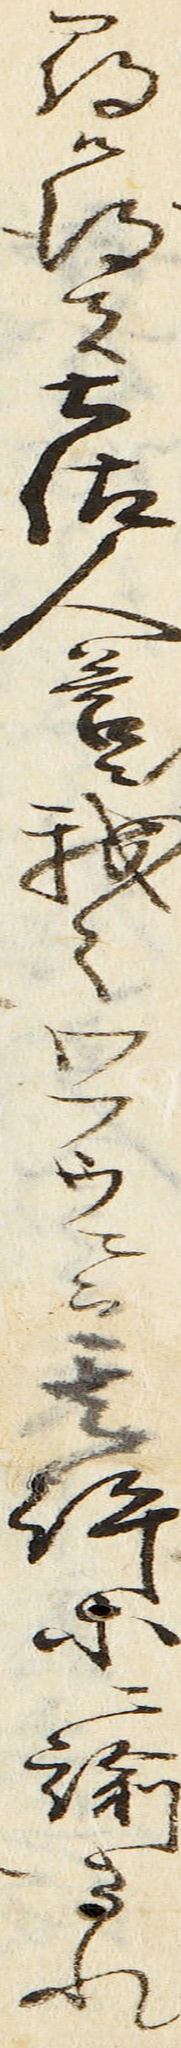尋候得者土佐人答ニ我々ワフウニ而其許等ニ諭され
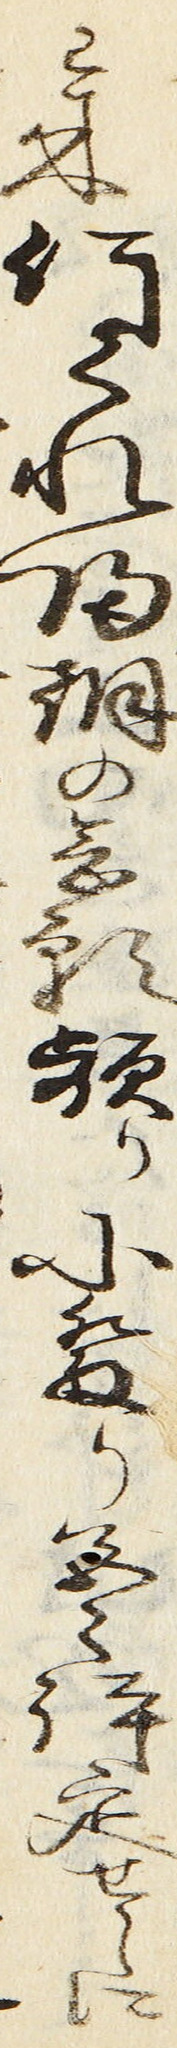已来何くれ帰朝の念願頻りに発り色々評定せしに
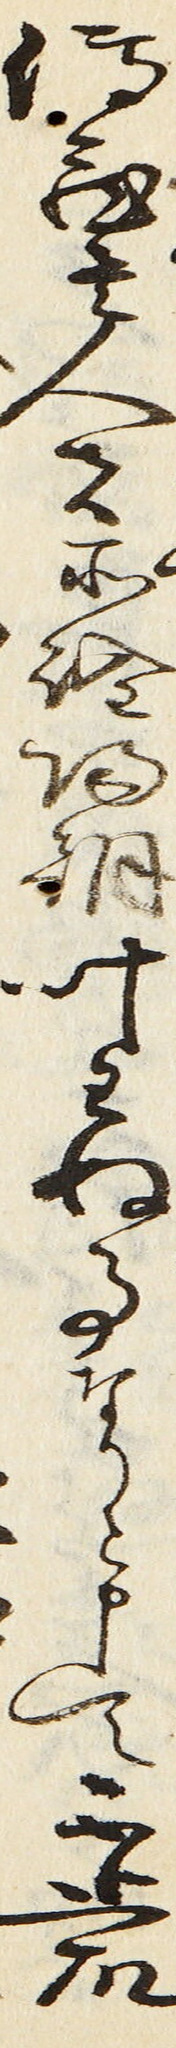伝蔵壱人は所詮帰朝叶わぬ事なりと申て不止故
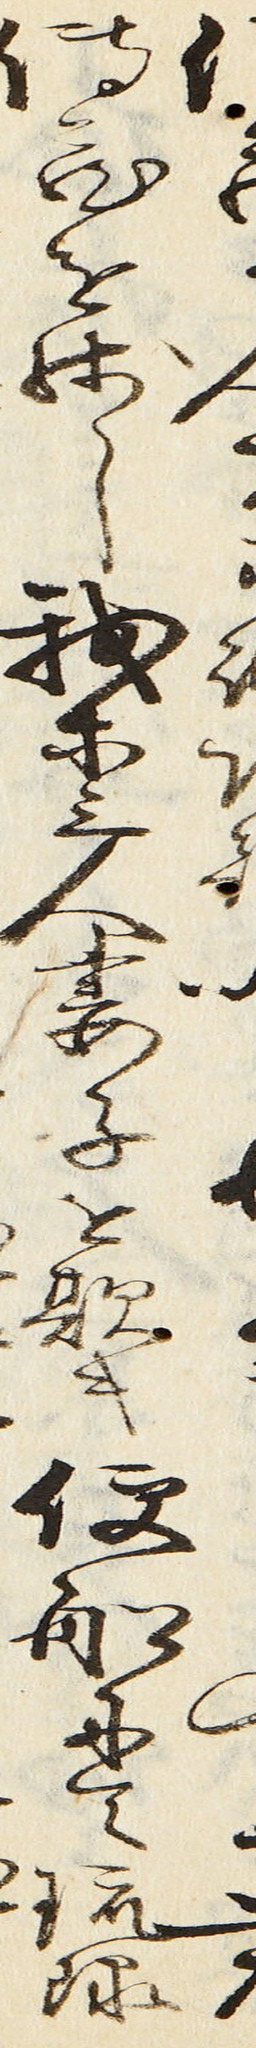伝蔵を残し我等三人妻子を欺キ便船にて琉球
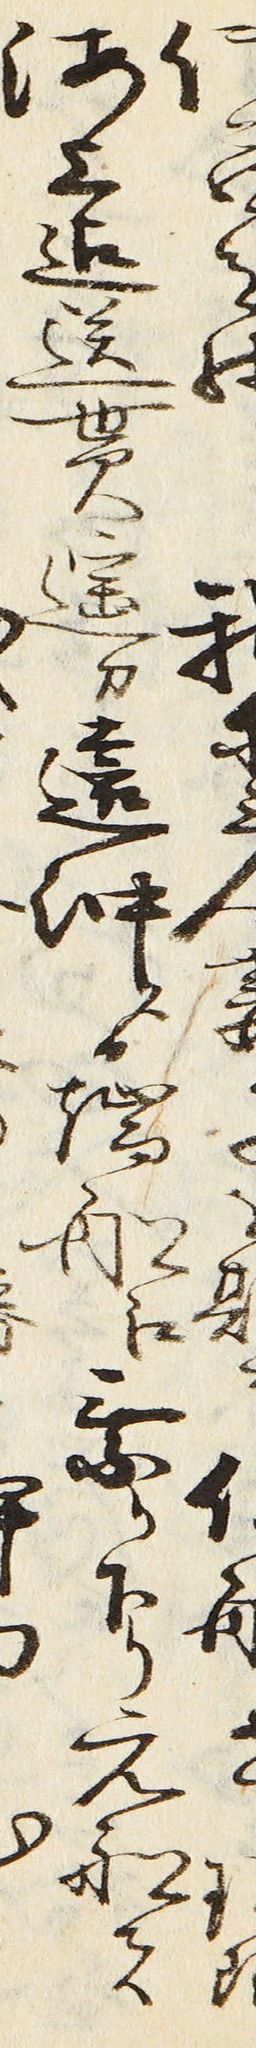海上迄送貰遥カ遠沖ゟ端船え乗り下り元船は
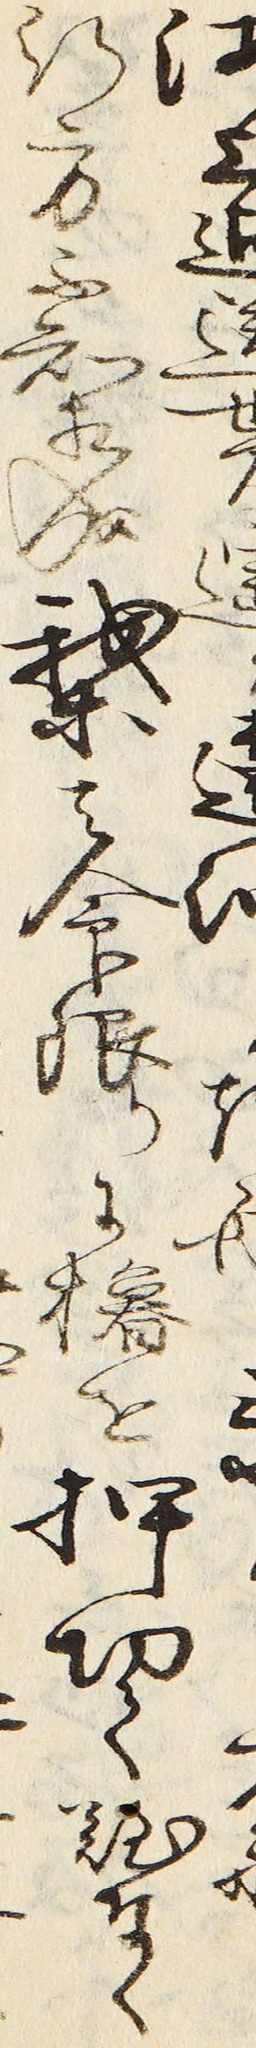行方不知相成我等は命限りに檣を押切て難なく
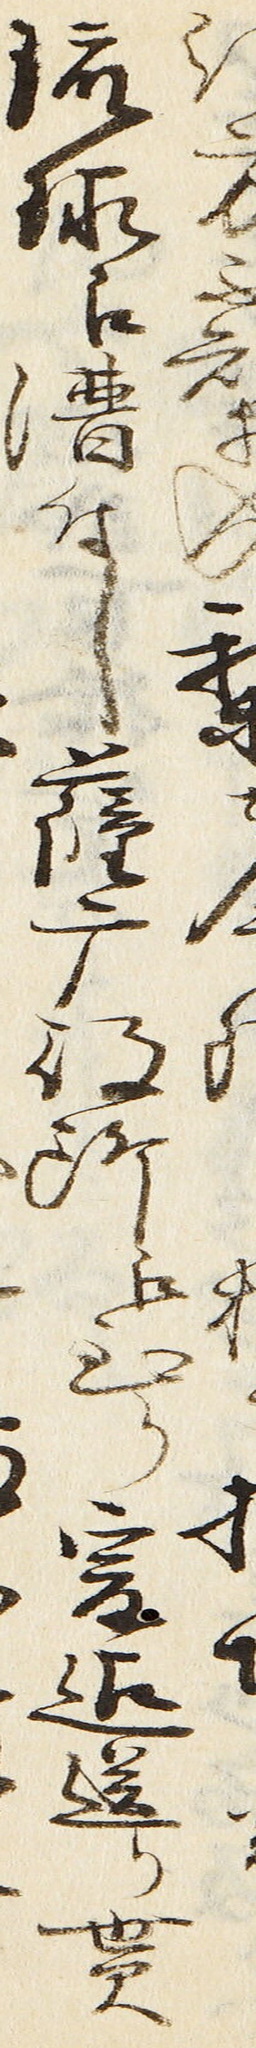琉球え漕付し薩摩役所え至り爰迄送り貰
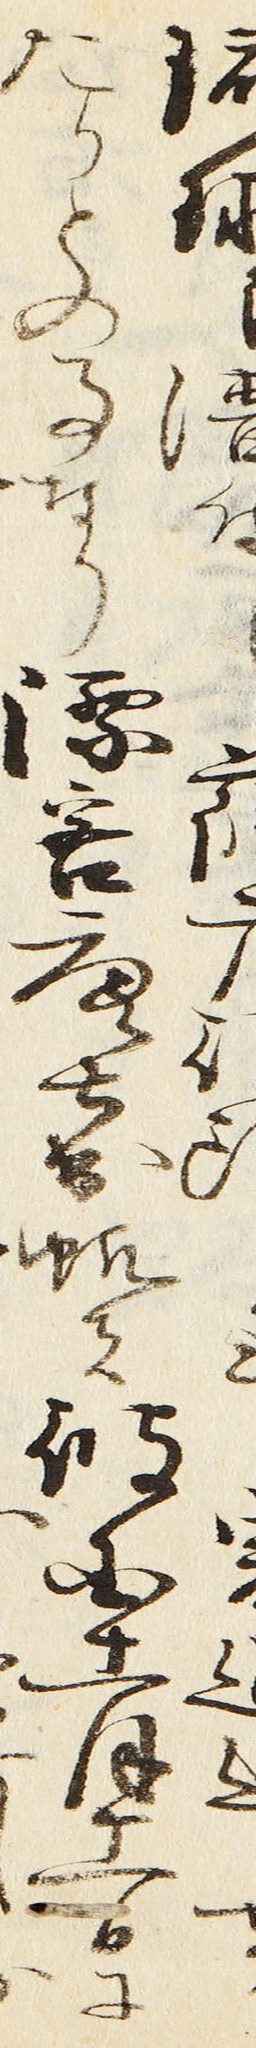たりとの事なり漂客唐土出帆は彼国十一月十一日に
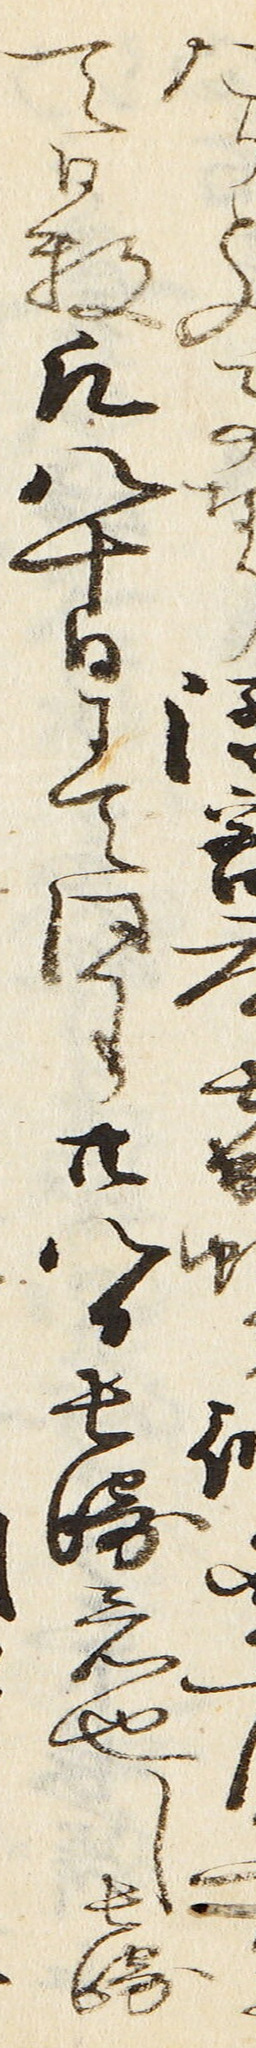て日数凡八十日にて同事廿八日長崎着也し長崎
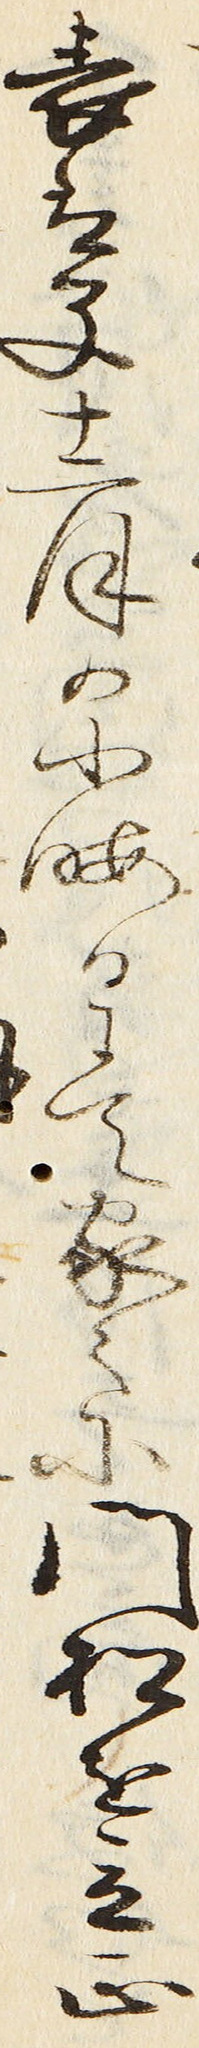表は子十二月の小晦日にて家々に門松を立正
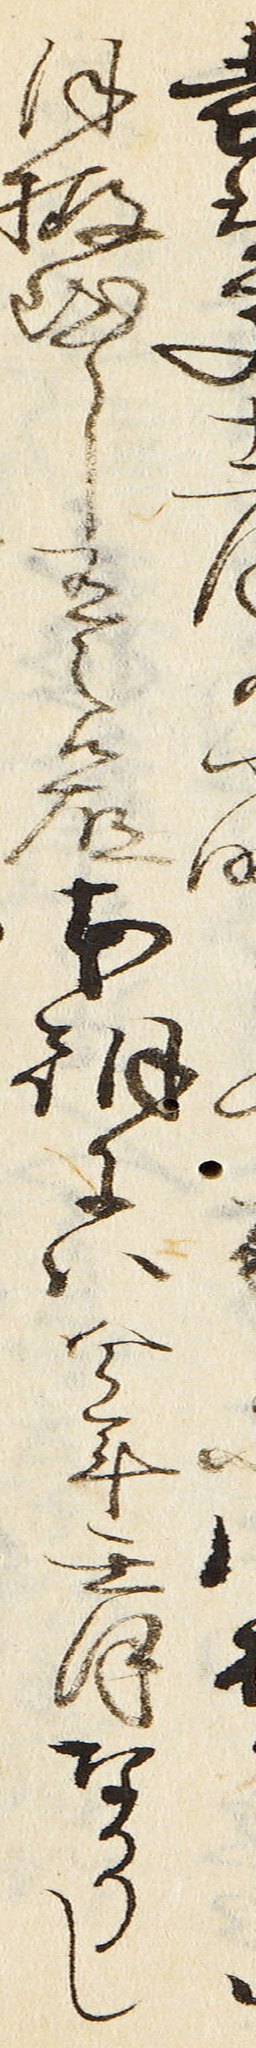月拵致し有之候故本朝にハ今年閏月なかりし
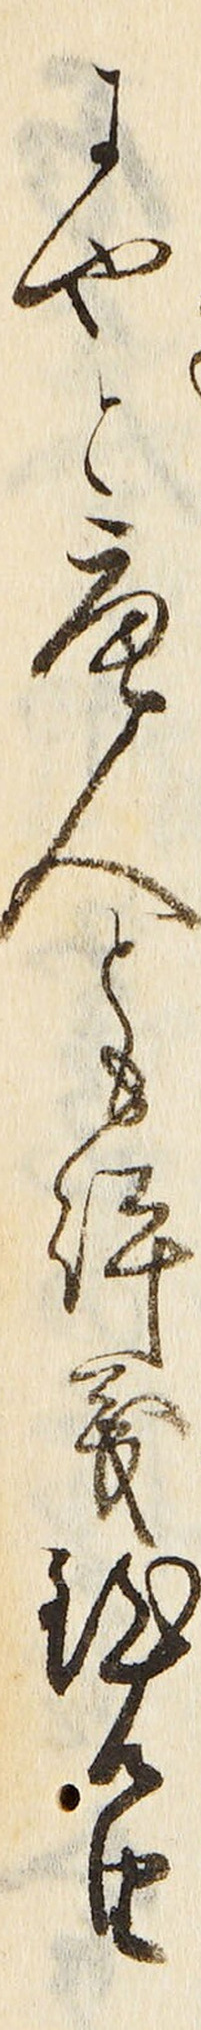にやと唐人とも評義致候由
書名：亜墨利加漂流記聞
